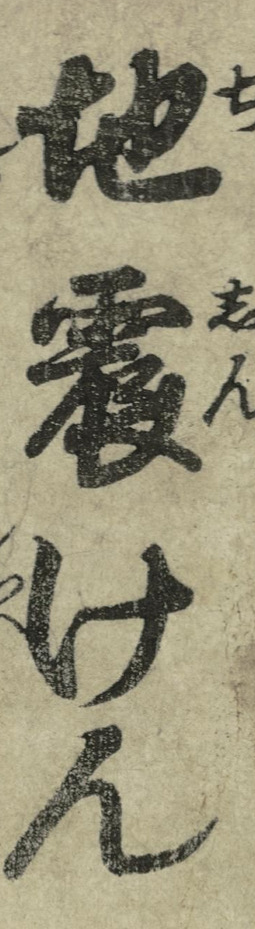地震けん
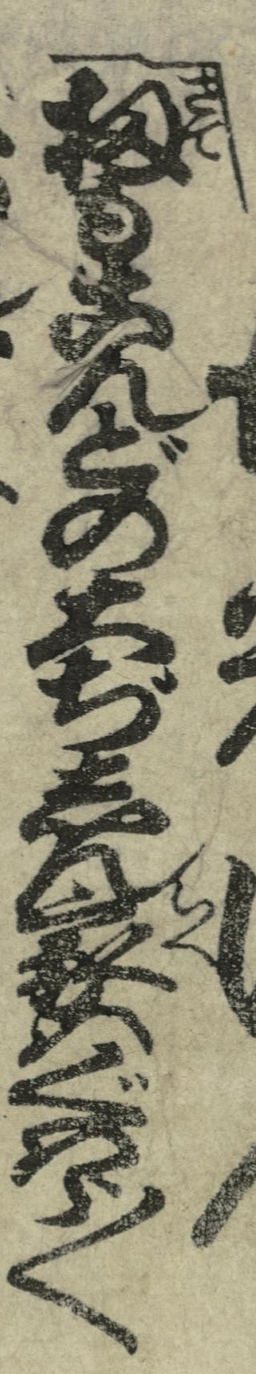〽扨もこんどの大ぢしん家はぐはら〳〵
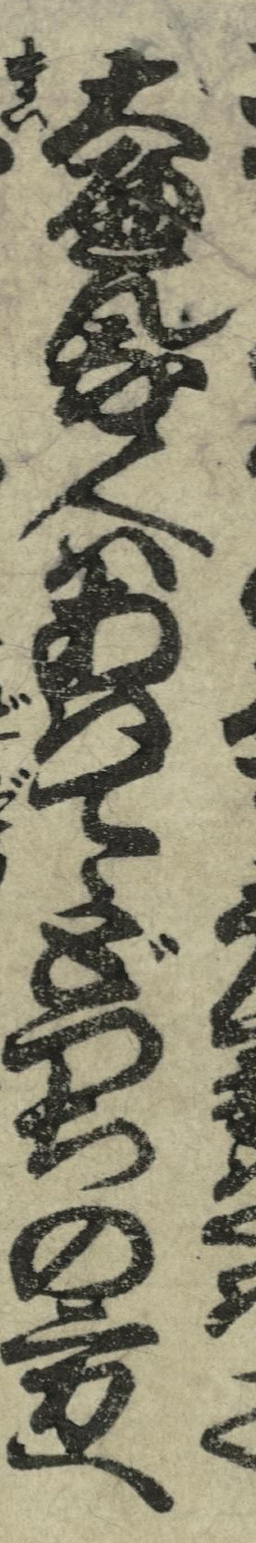大へんな人はあはてゝどつちの方へ
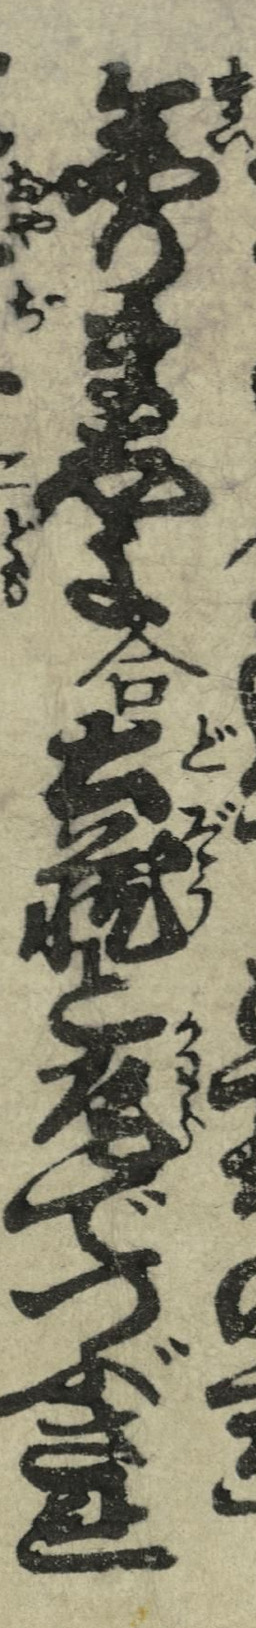参りましよ合土蔵と瓦でつぶされ
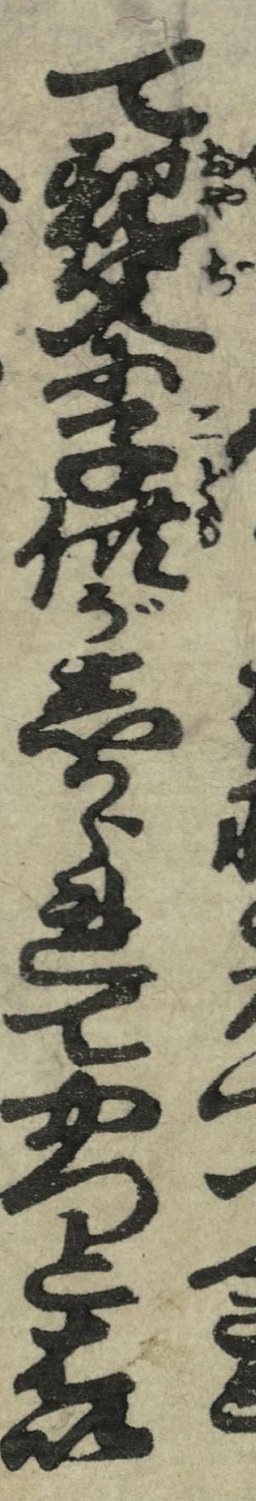て親父に子供がしかられてやつとはい
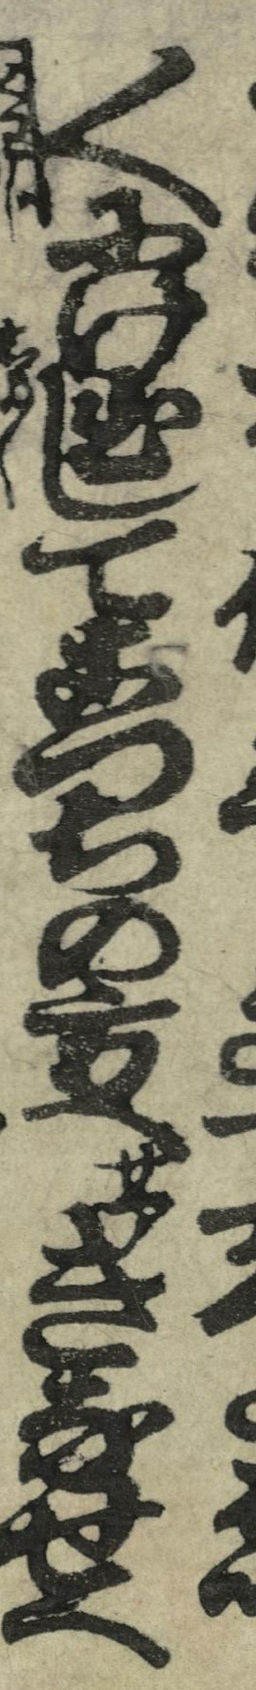〳〵にけ出してこつちの方へサアきなせへ
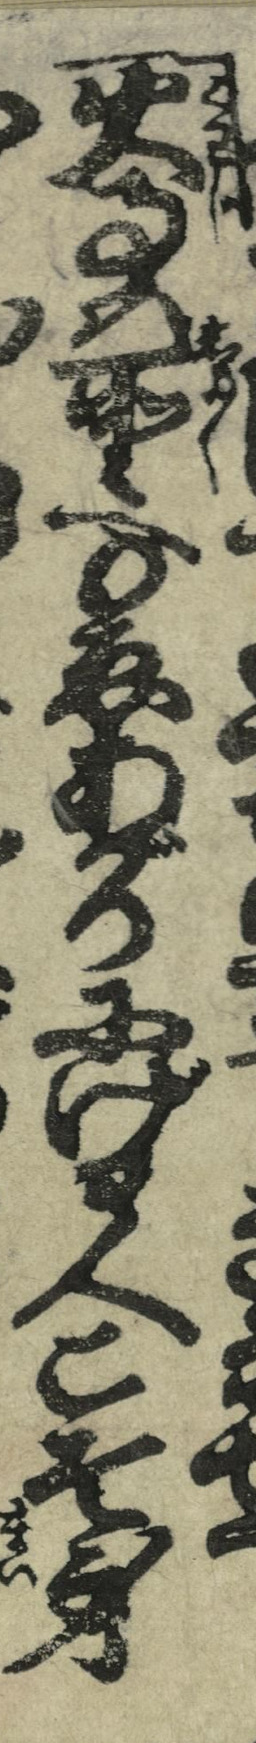〽火事は所〻へもゑあがりにげる人こそ身
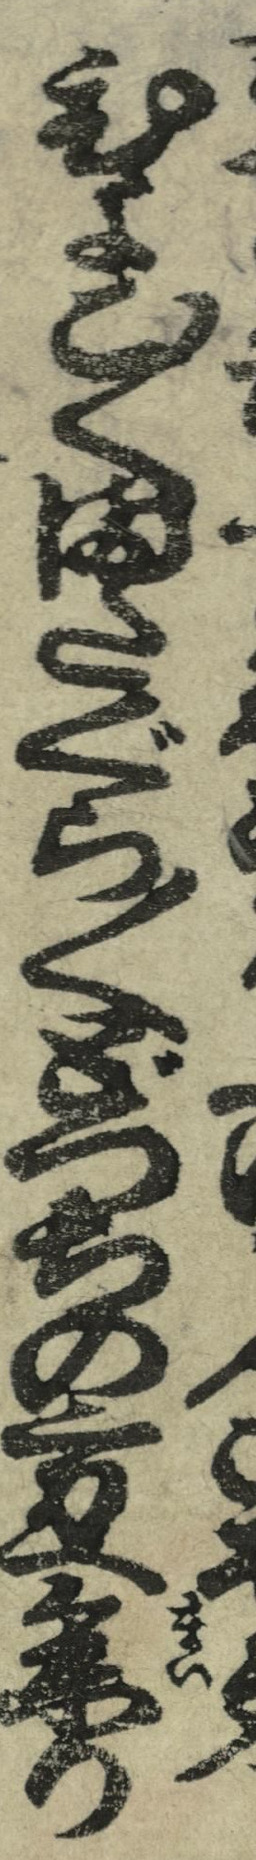ひよこ〳〵またぐら〳〵どつちの方へ参り
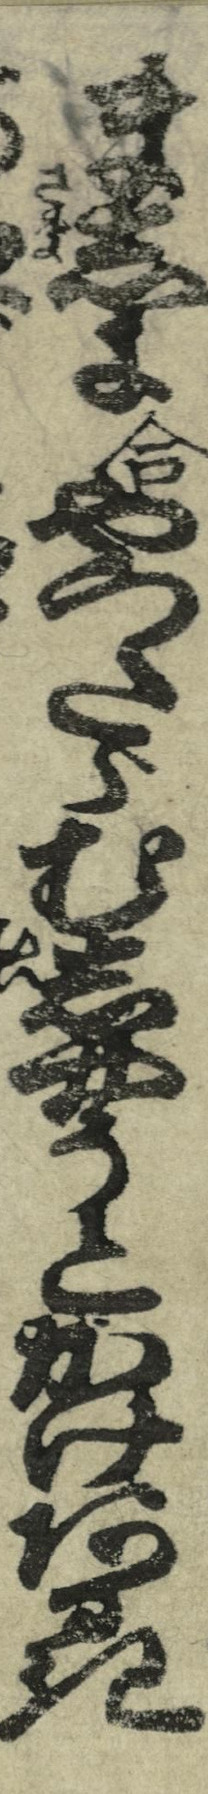ましよ合やつたらむしやうとかけあるき
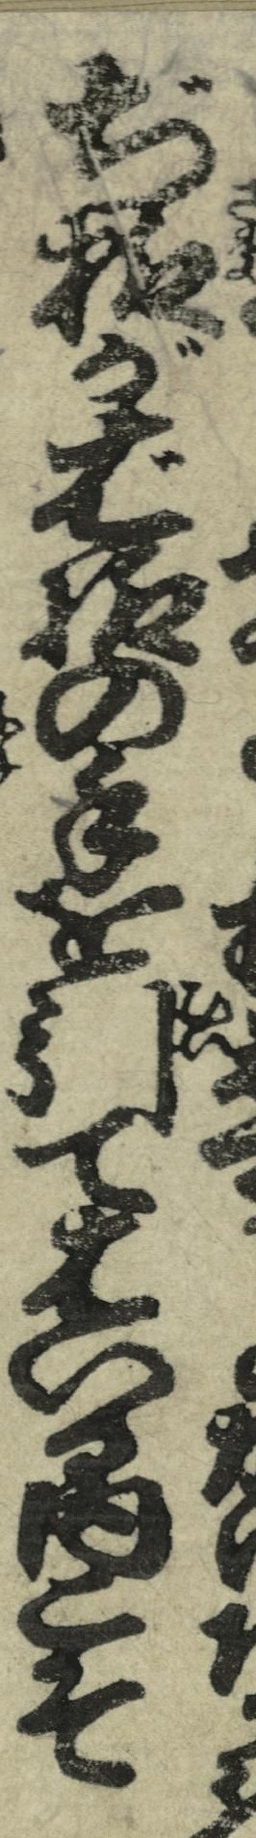ぢ様がば様の手を引てはいる内こそ
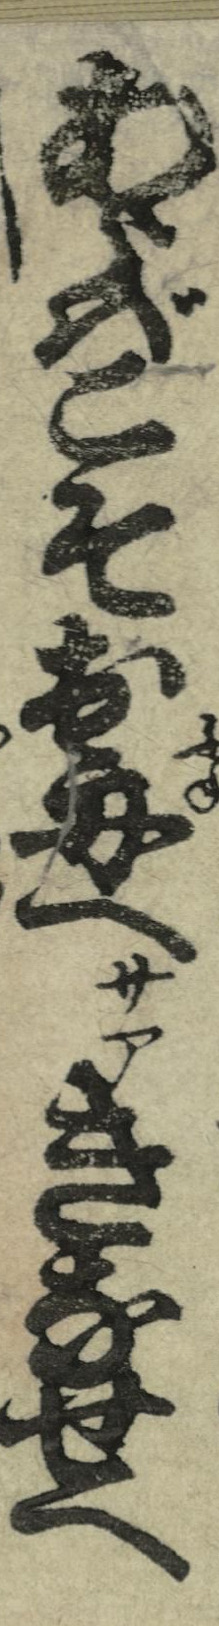あらばこそお舟へサアきなせへ
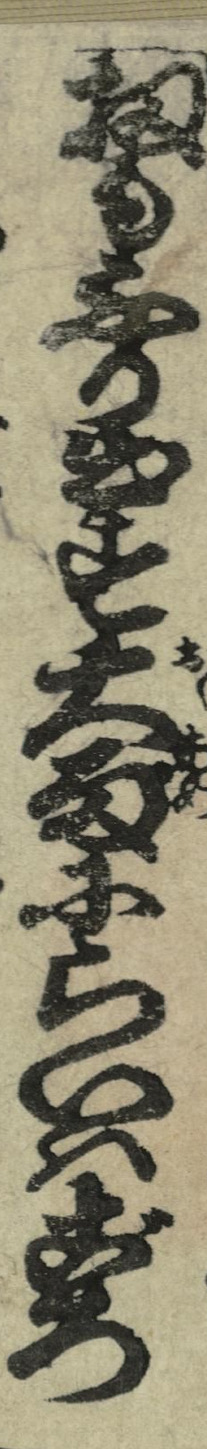〽扨もふり出す大雨にらいはごろ
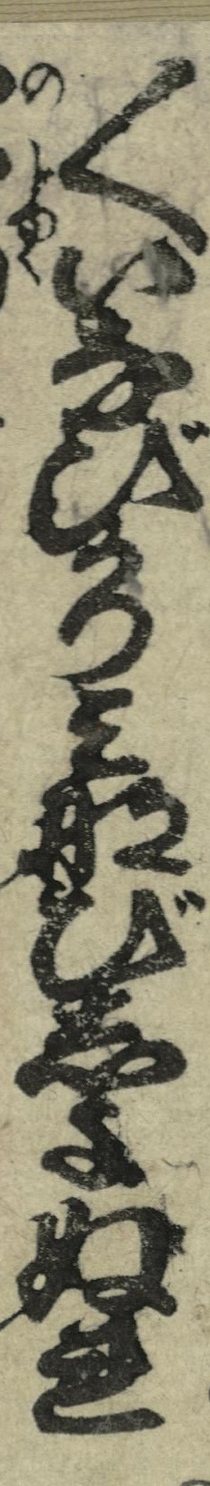〳〵いなびかりみなびしよぬれ
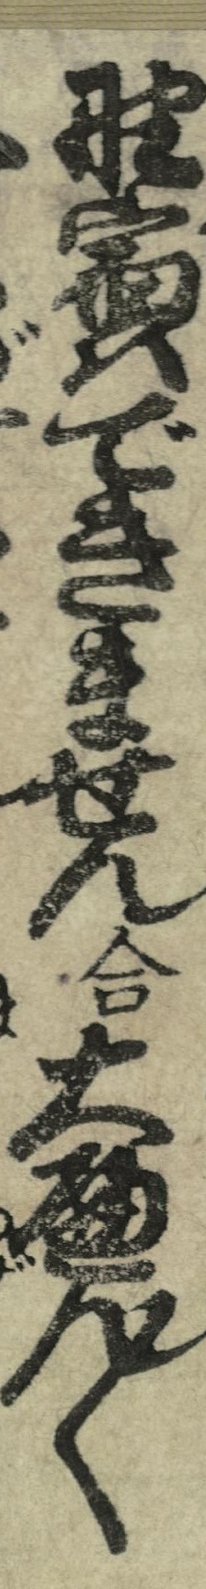野宿はできません合大へん〳〵
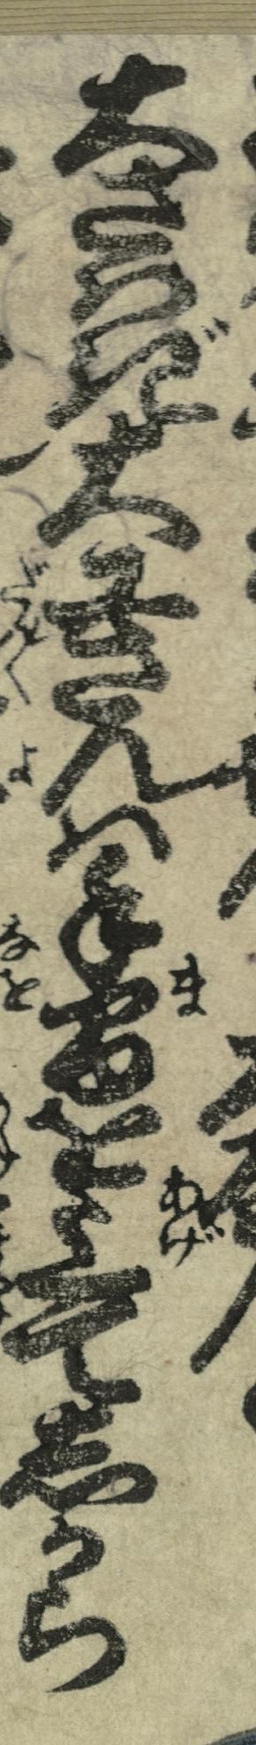大さはぎ大工さんは手間を上てしから
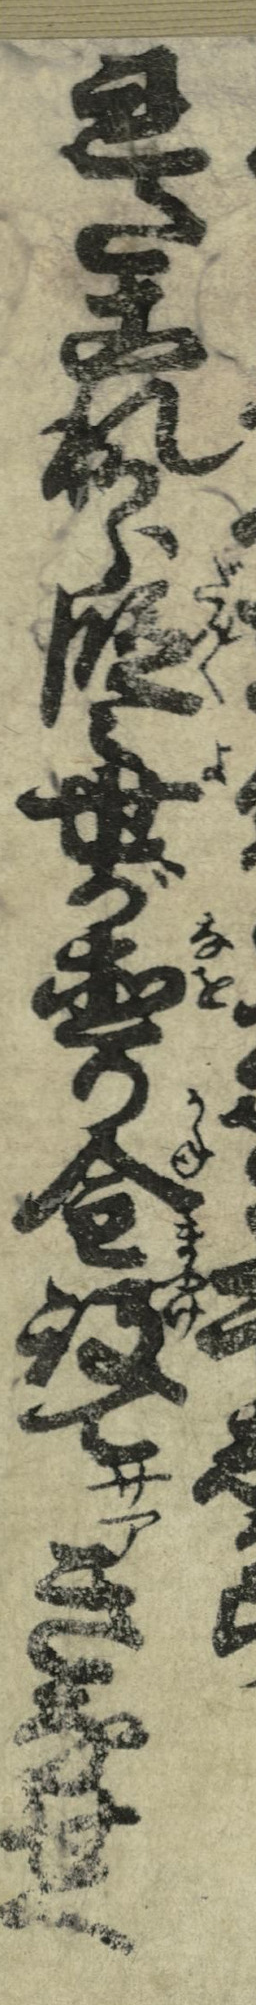れたこれから段〻世が直り金設てサアきなせへ
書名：地震けん
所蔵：東京大学地震研究所図書室 Earthquake Research Institute Library, The University of Tokyo, JAPAN
